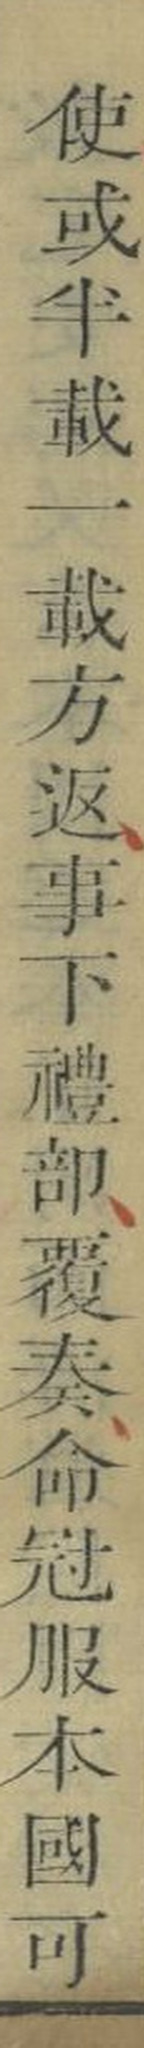使或半載一載方返事下礼部覆奏命冠服本国可
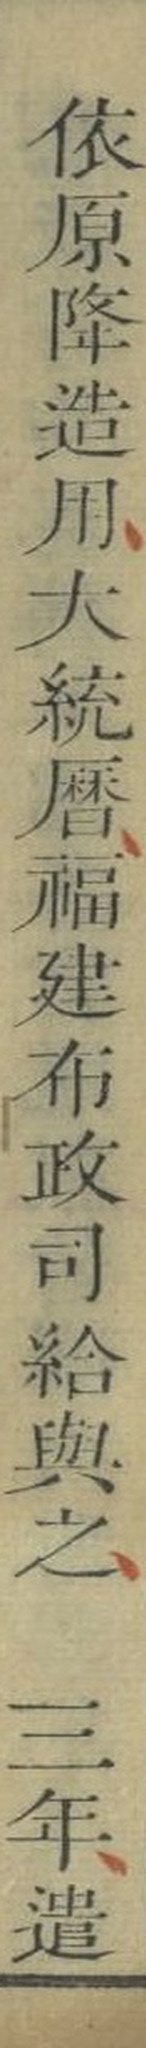依原降造用大統暦福建布政司給与之三年遣
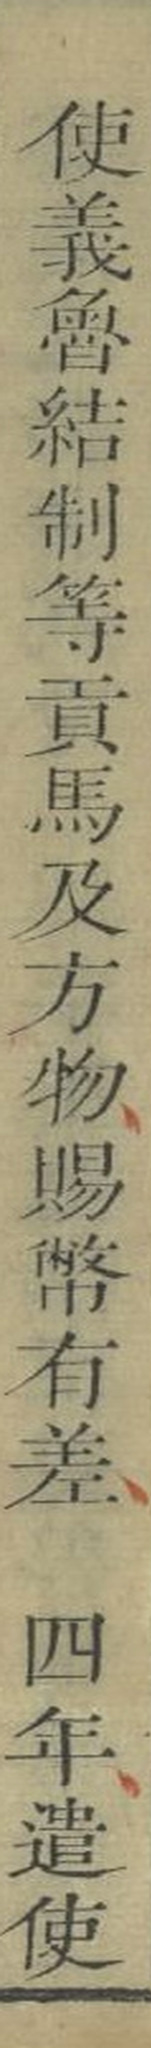使義魯結制等貢馬及方物賜幣有差四年遣使
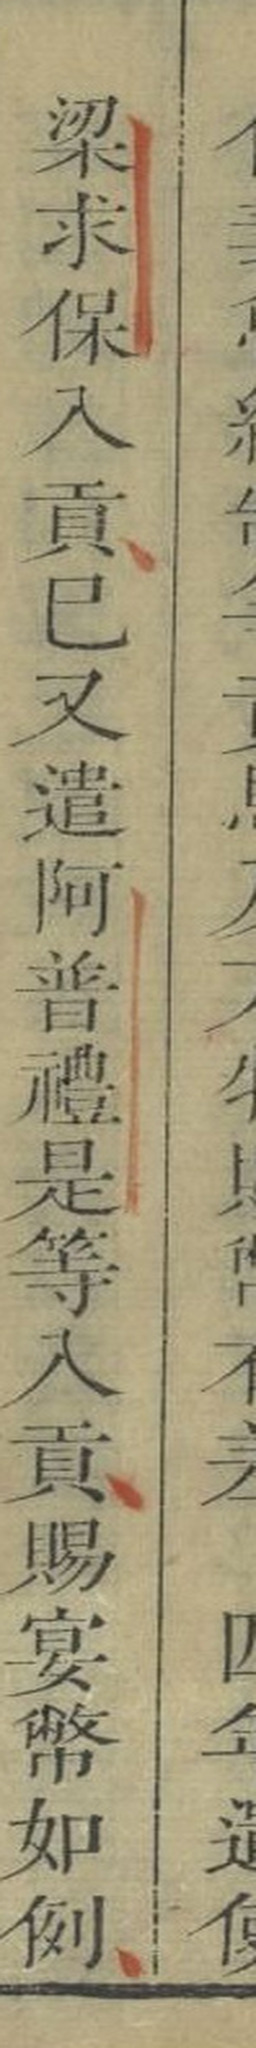梁求保入貢巳又遣阿普礼是等入貢賜宴幣如例
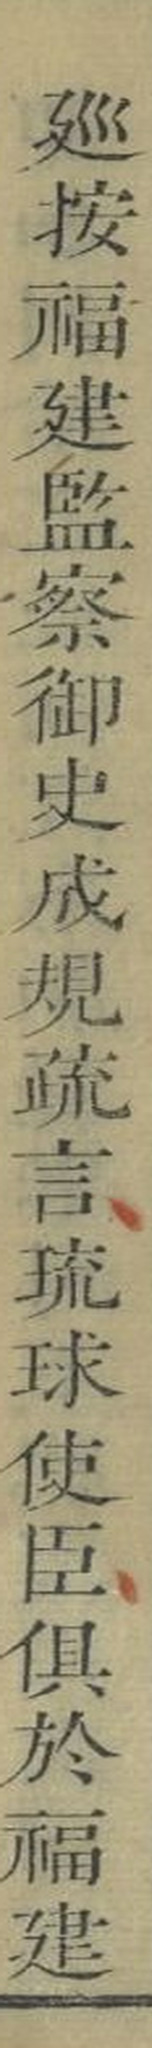巡按福建監察御史成規疏言琉球使臣俱於福建
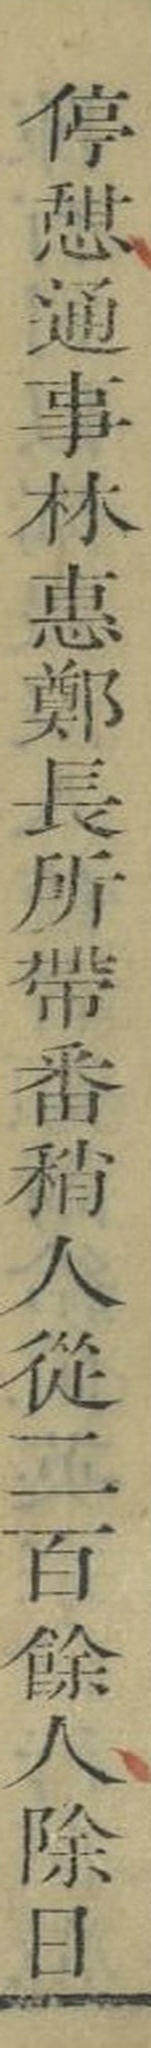停憩通事林恵鄭長所帯番稍人従二百余人除日
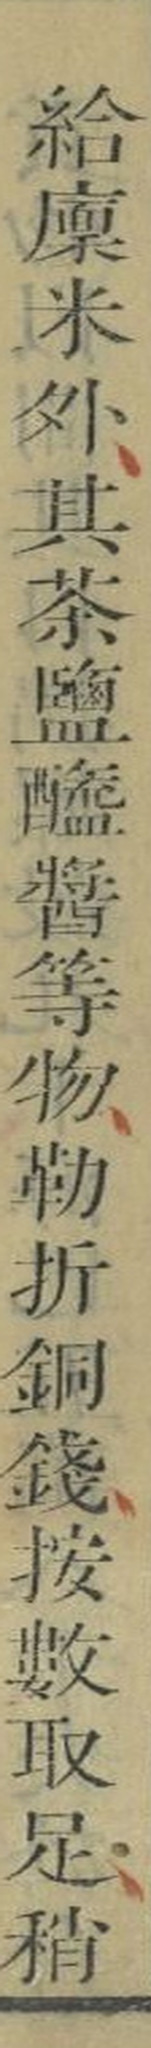給廩米外其茶塩醯醤等物勒折銅銭按数取足稍
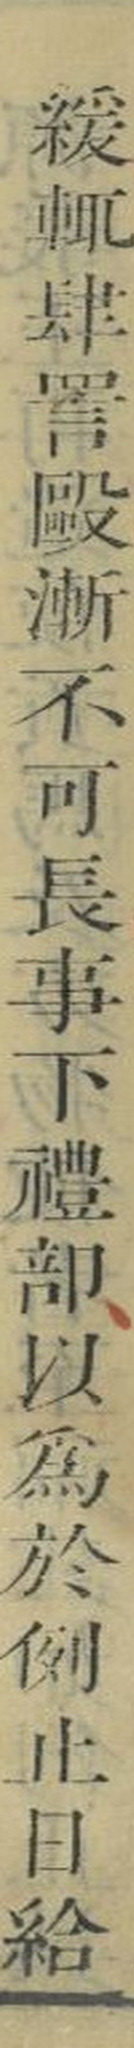緩輒肆詈殴漸不可長事下礼部以為於例止日給
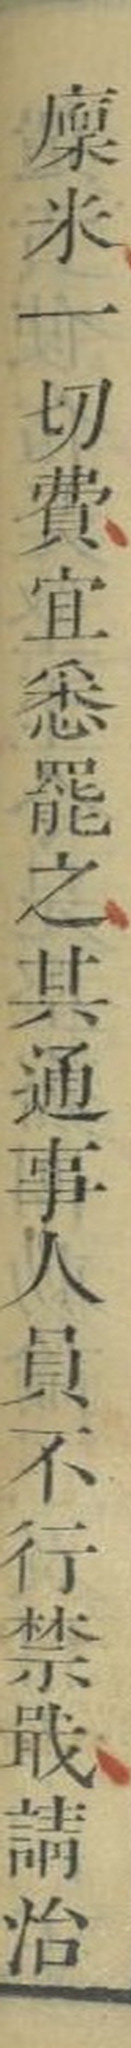廩米一切費宜悉罷之其通事人員不行禁戢請治
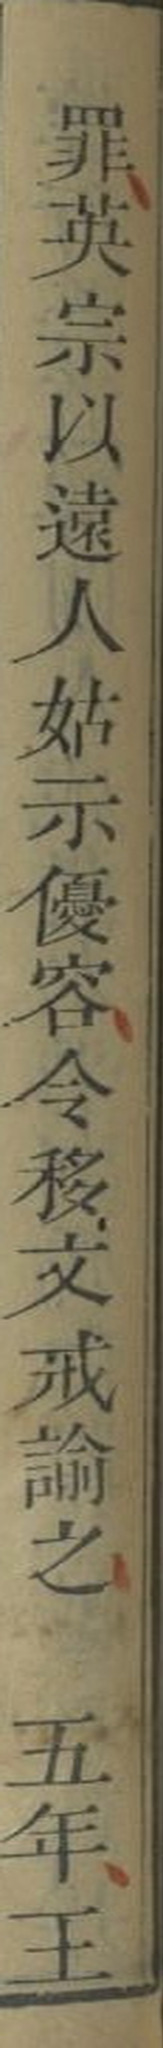罪英宗以遠人姑示優容令移文戒諭之五年王
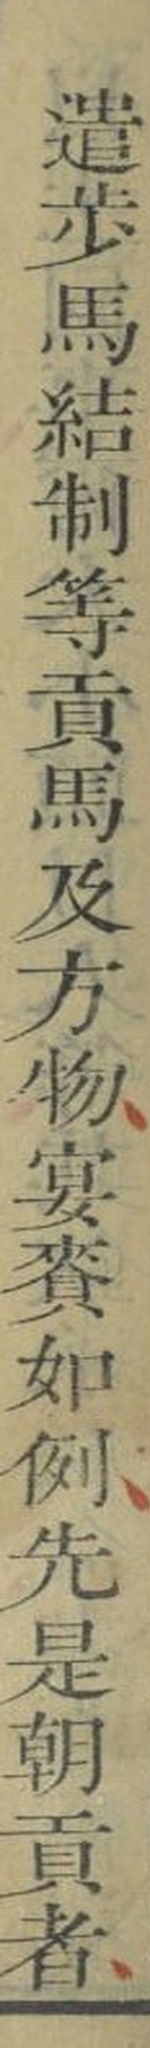遣歩馬結制等貢馬及方物宴賚如例先是朝貢者
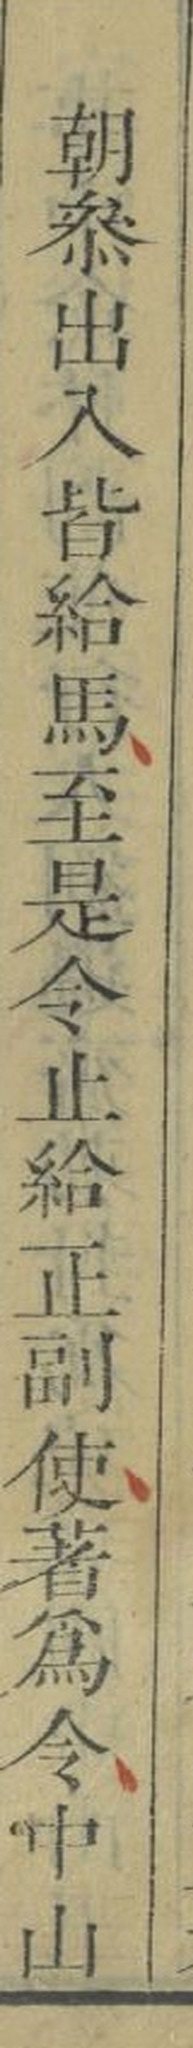朝参出入皆給馬至是令止給正副使著為令中山
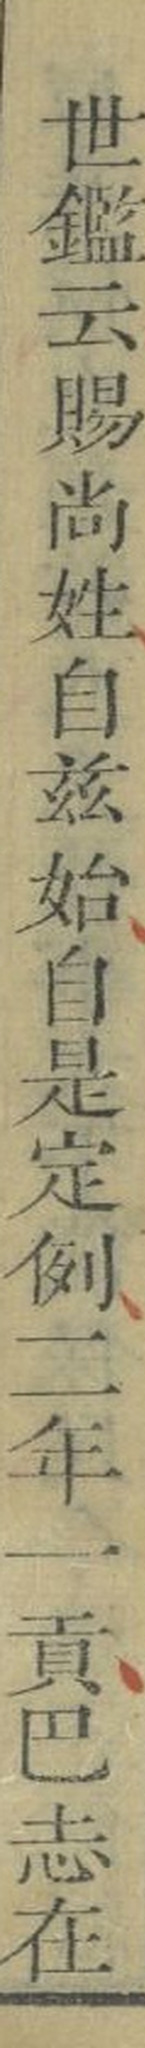世鑑云賜尚姓自茲始自是定例二年一貢巴志在
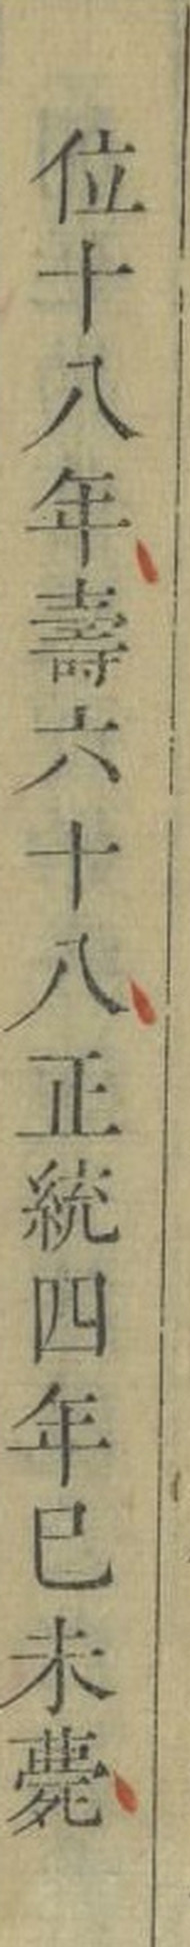位十八年寿六十八正統四年巳未薨
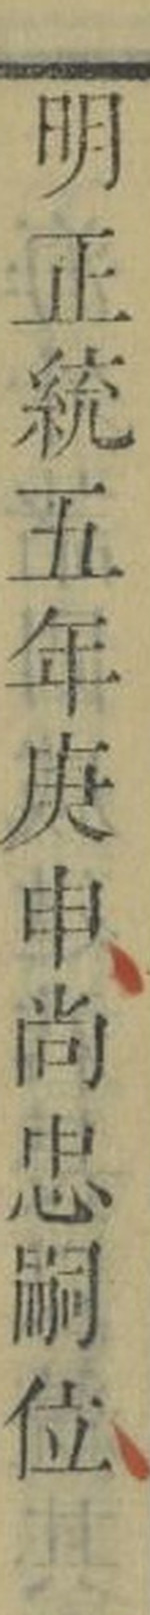明正統五年庚申尚忠嗣位
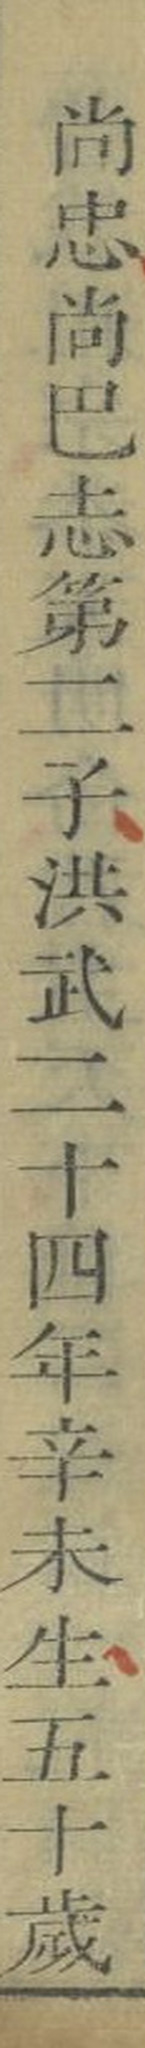尚忠尚巴志第二子洪武二十四年辛未生五十歳
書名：中山伝信録 巻三
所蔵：University of the Ryukyus Library
